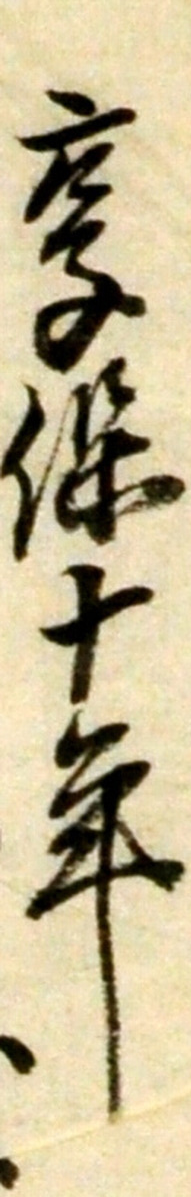享保十年
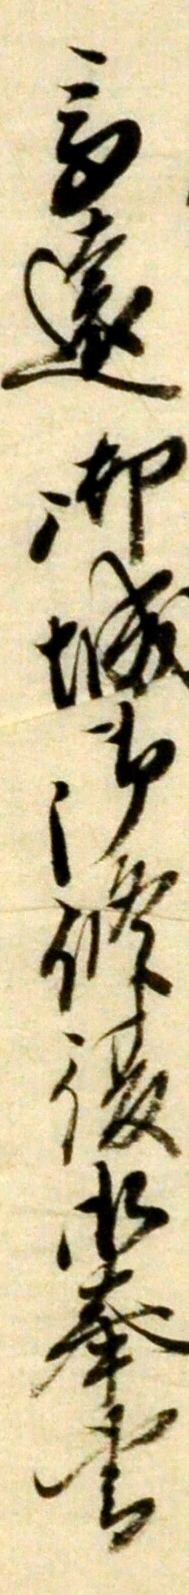高遠御城御修復御奉書

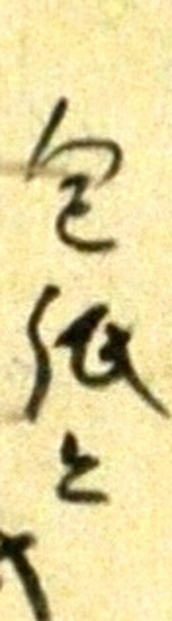包紙と
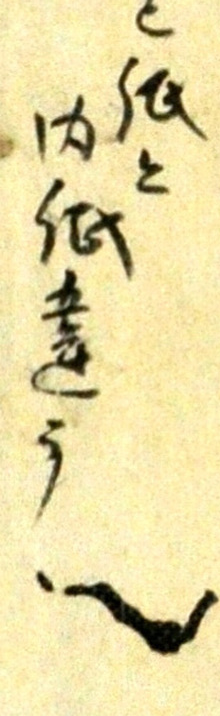内紙違う
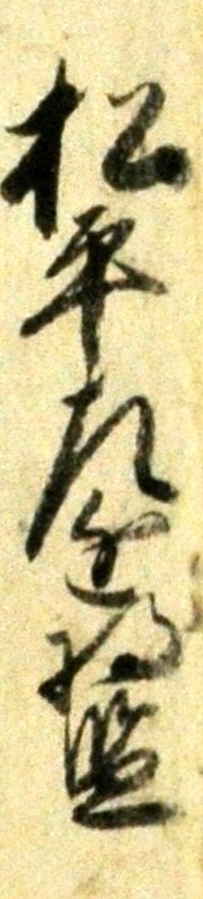松平左近将監
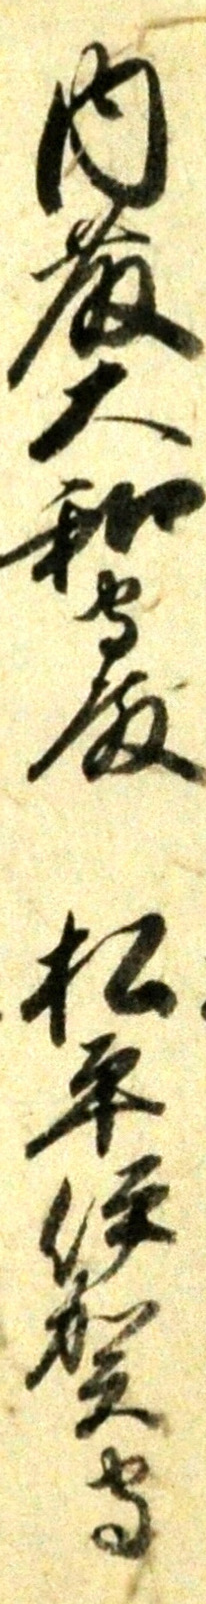内藤大和守殿松平伊賀守
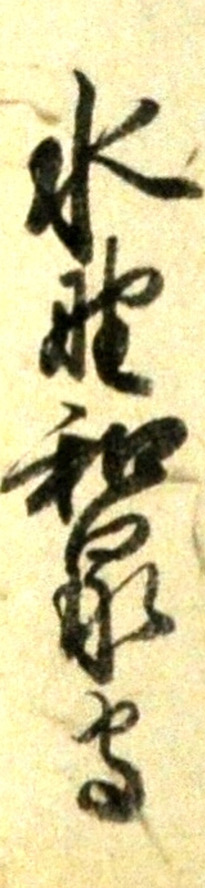水野和泉守
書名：包紙
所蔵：伊那市立高遠町図書館・合同会社AMANE
